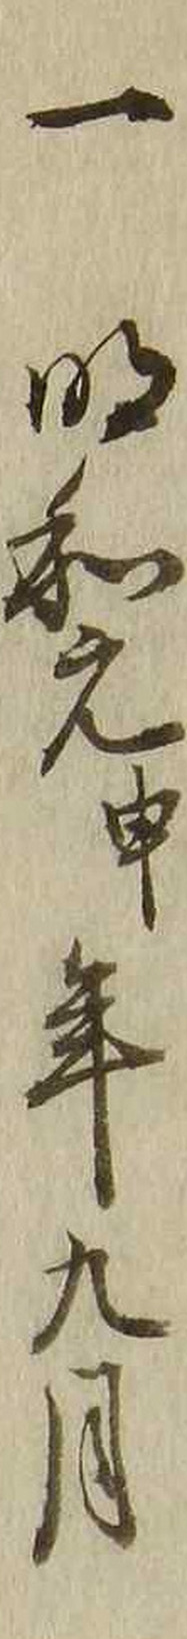一明和元申年九月
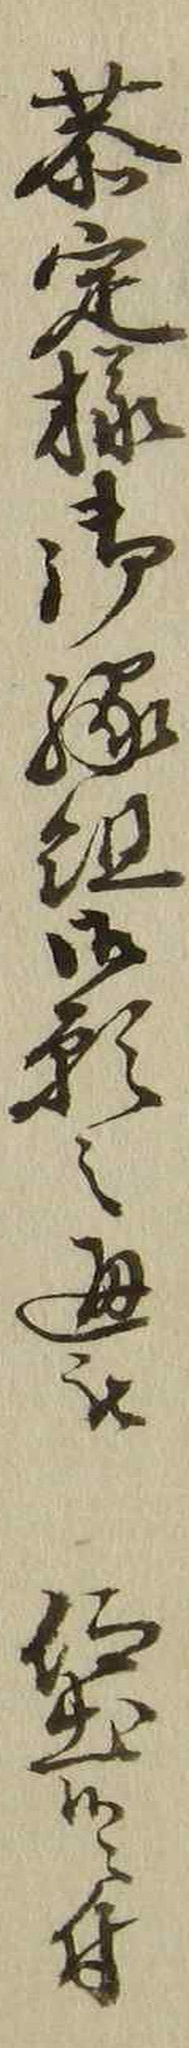恭定様御縁組御願之通被仰出候ニ付
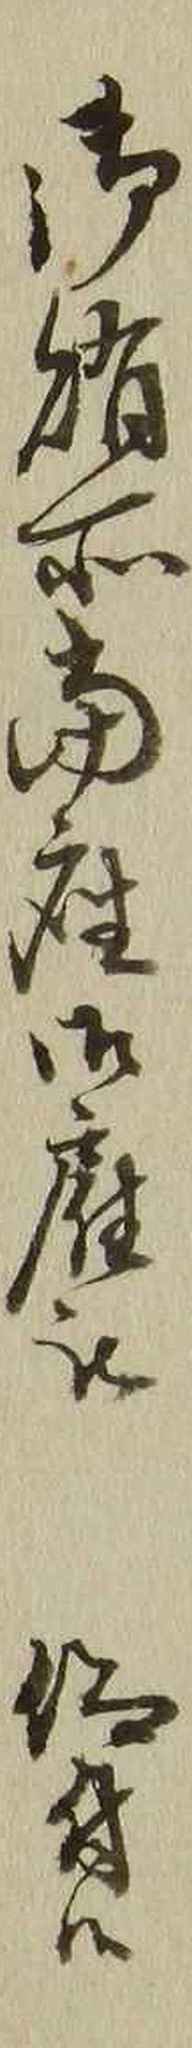御賄所当座御雇被仰付候
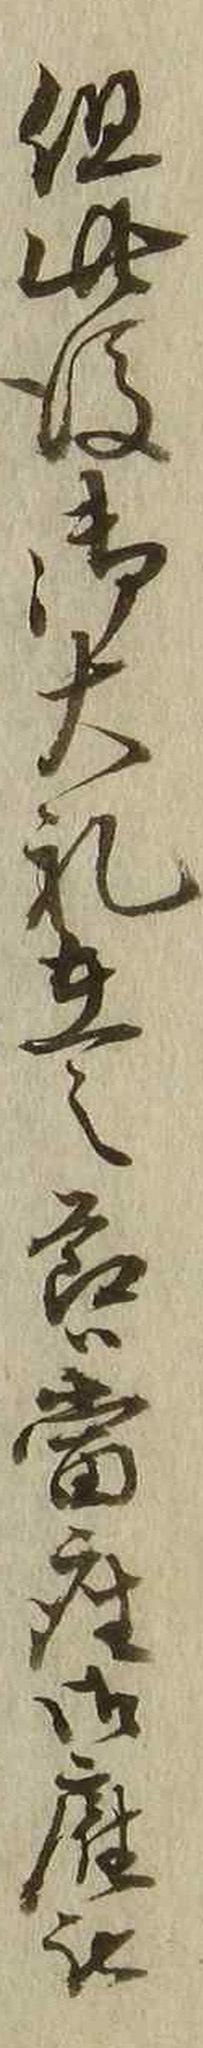但此後御大礼在之節ハ当座御雇被
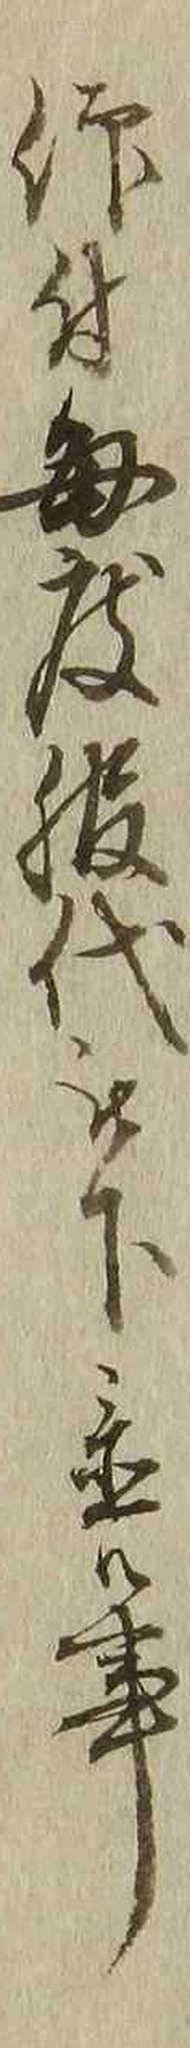仰付毎度服代被下置候事
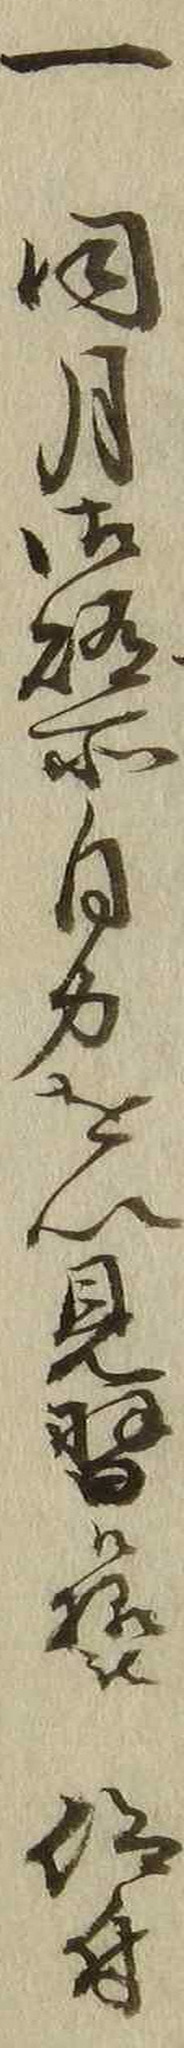一同月御賄所自力を以見習候様被仰付
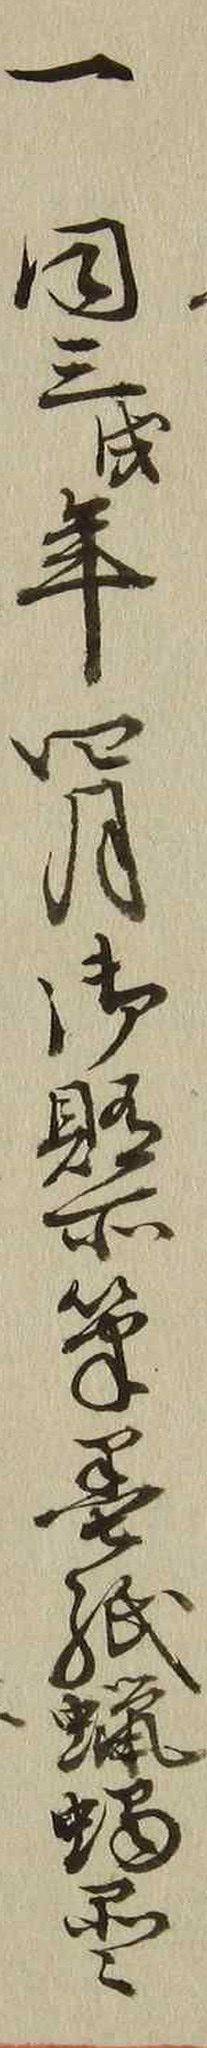一同三戌年四月御賄所筆墨紙蠟燭品々
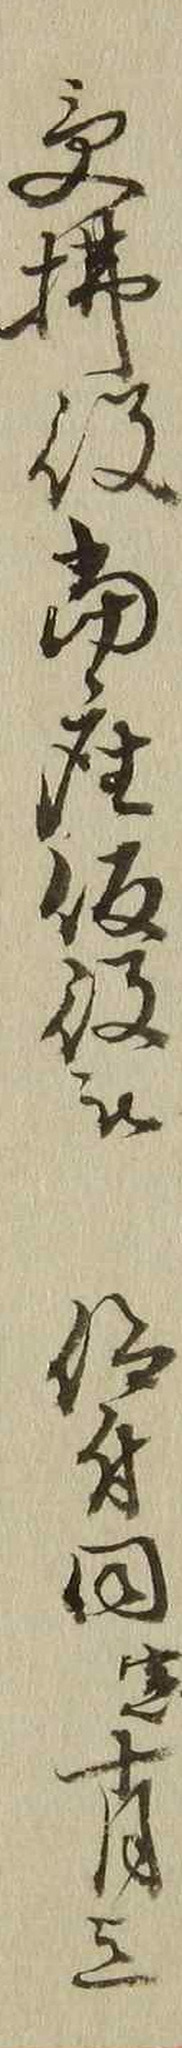受払役当座仮役被仰付同寅十月迄
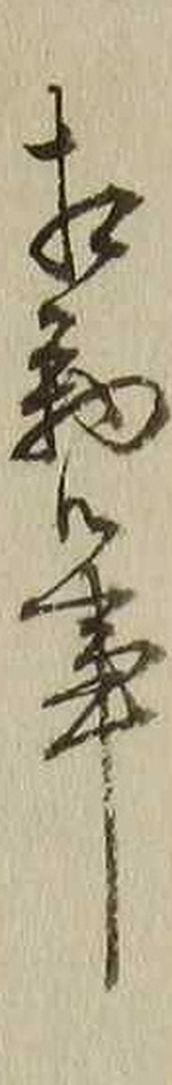相勤候事
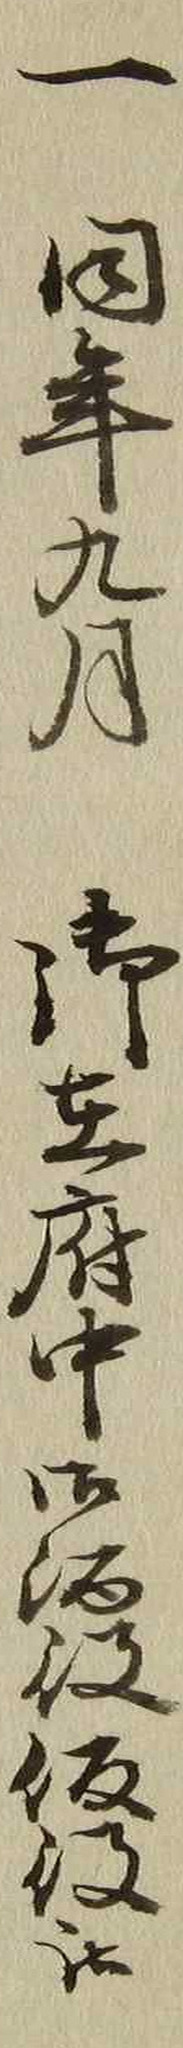一同年九月御在府中御酒役仮役被
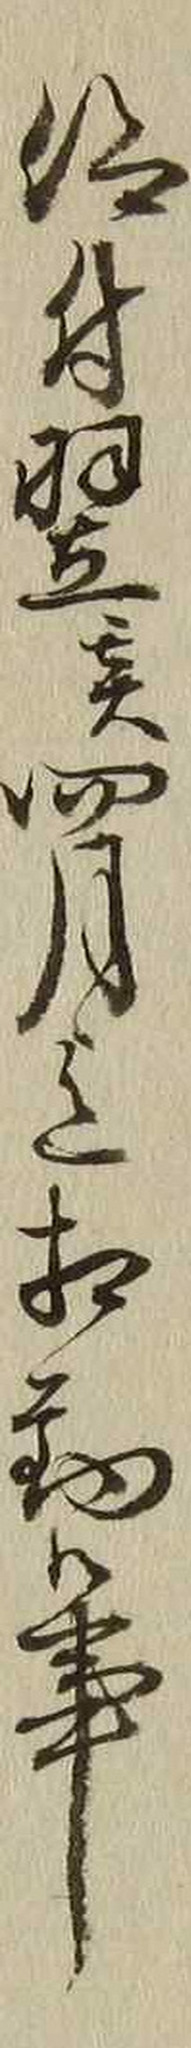仰付翌亥四月迄相勤候事
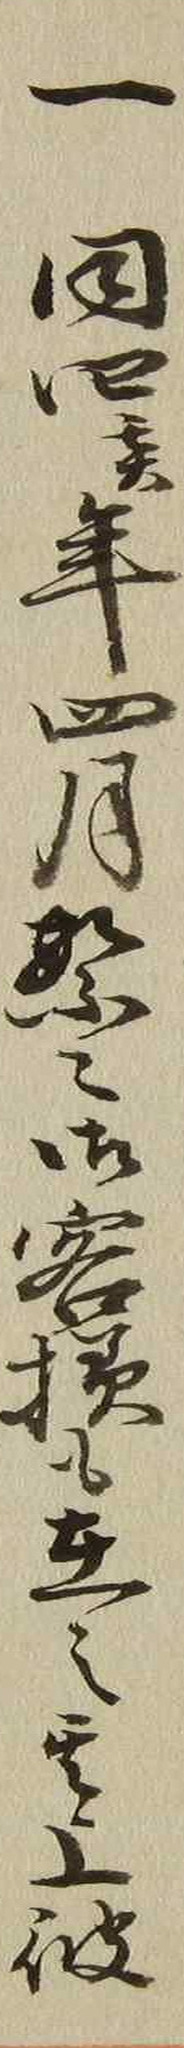一同四亥年四月繁々御客様も在之其上彼
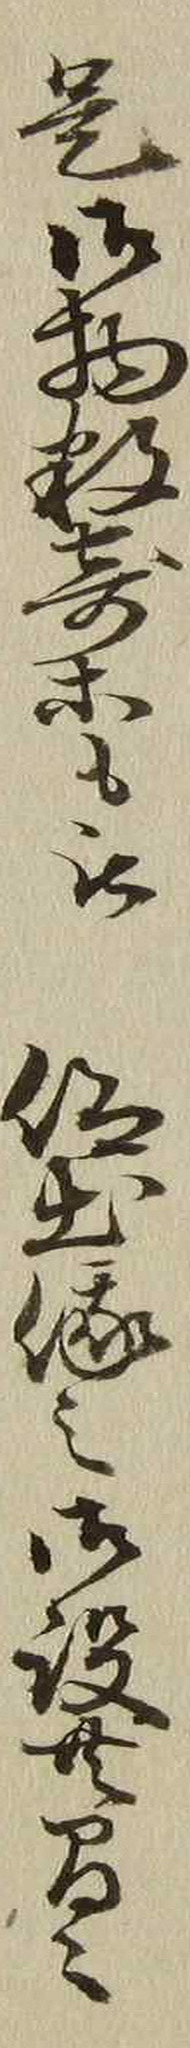是御物数奇等も被仰出俄之御役共間々
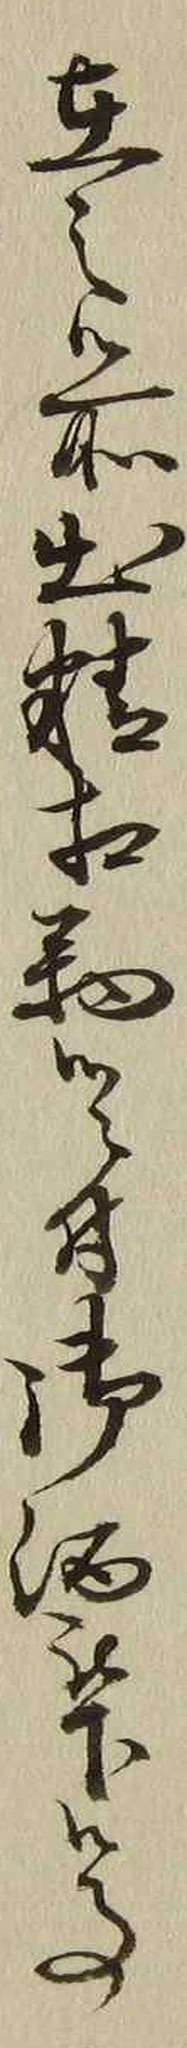在之候所出精相勤候ニ付御酒被下候事
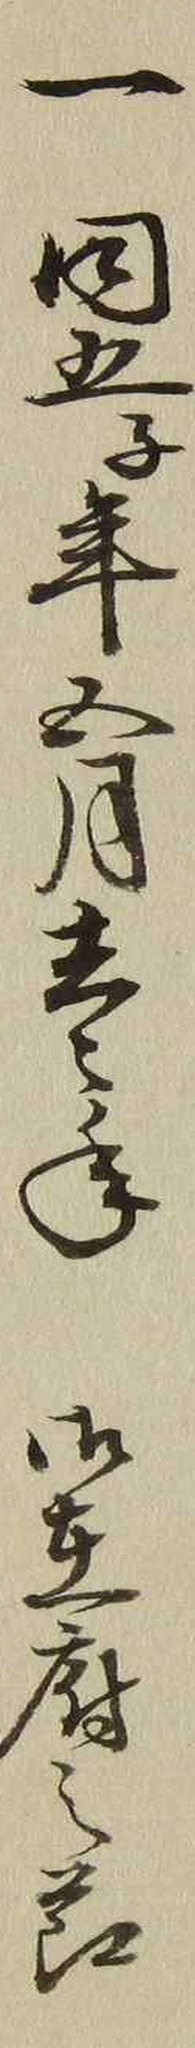一同五子年五月去々年御在府之節
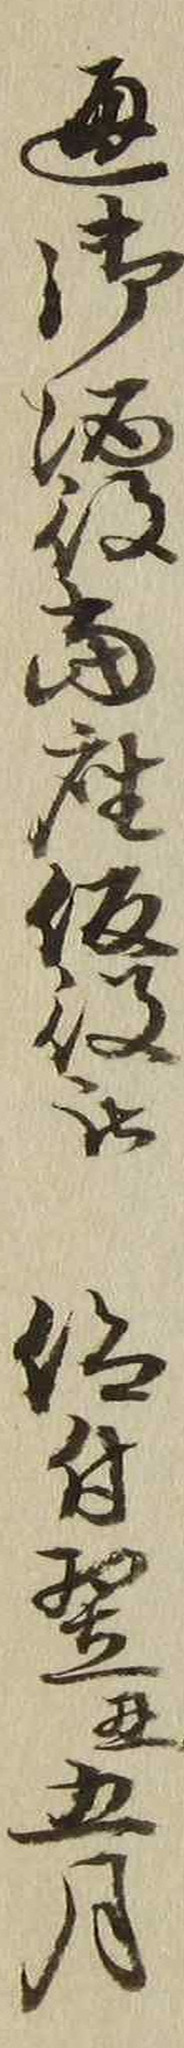通御酒役当座仮役被仰付翌丑五月
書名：諸士系譜　巻之64　と之部7
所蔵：会津若松市立会津図書館
